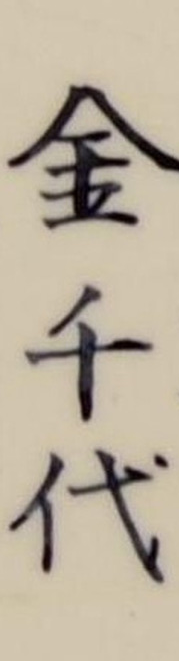金千代
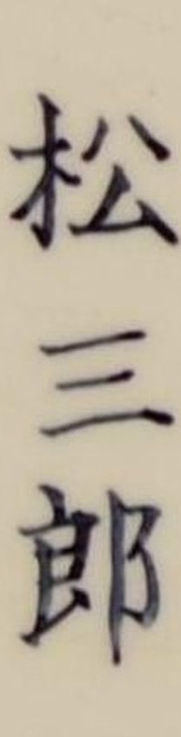松三郎
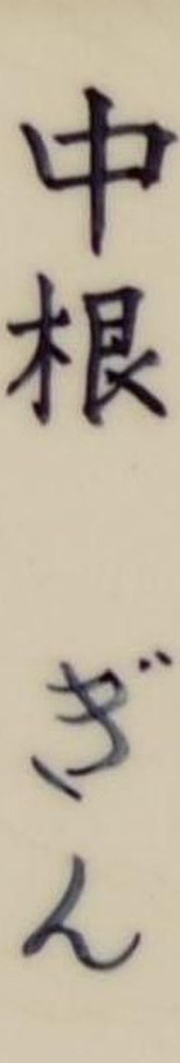中根ぎん
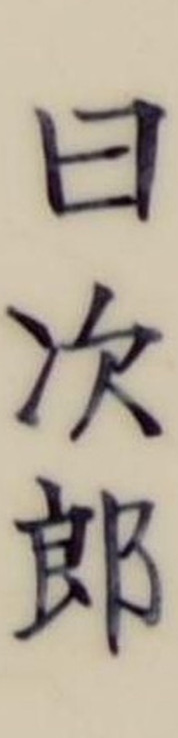曰次郎
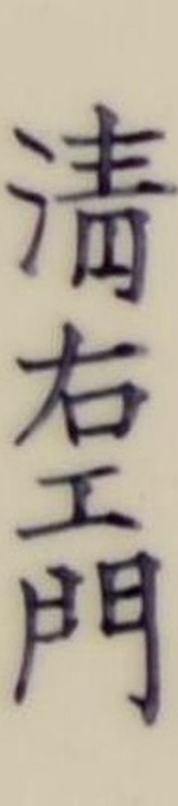清右エ門

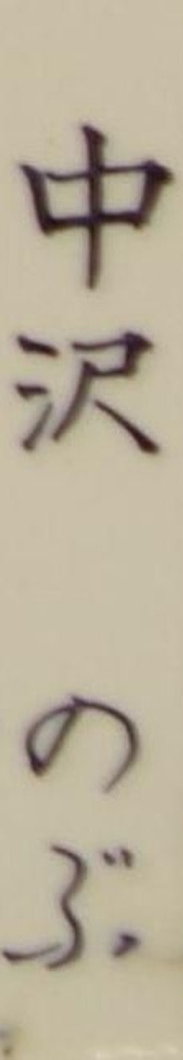中沢のぶ
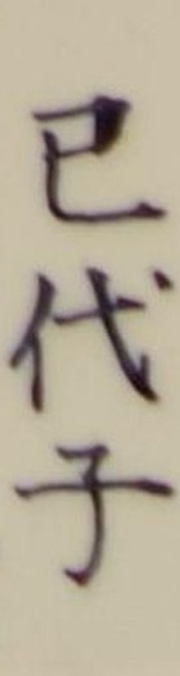巳代子
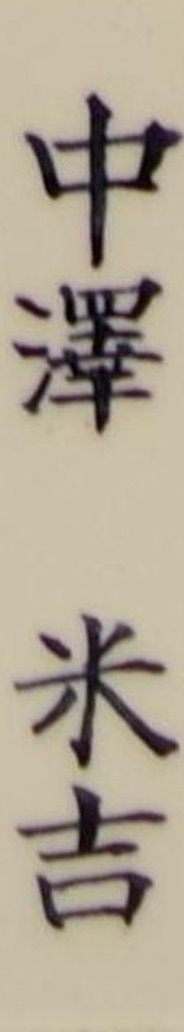中澤米吉
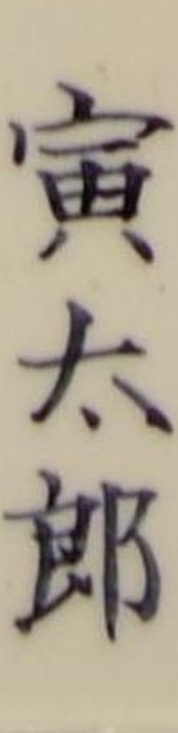寅太郎

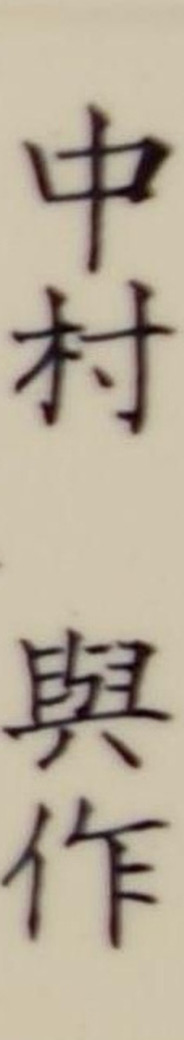中村與作
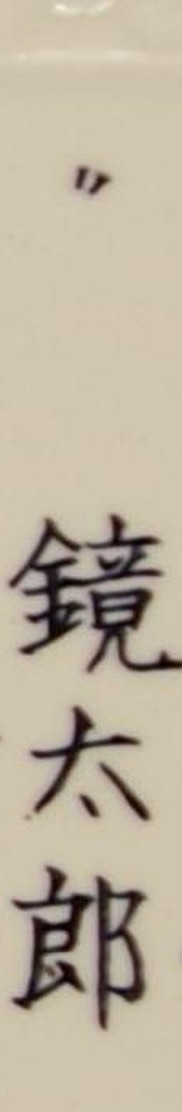鏡太郎
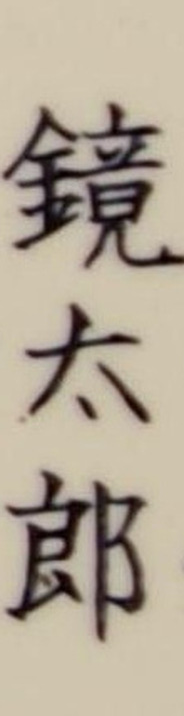鏡太郎
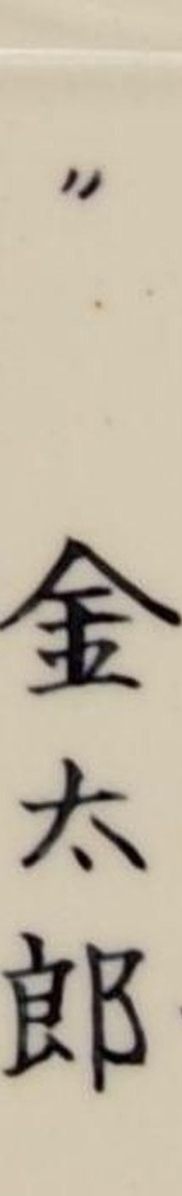金太郎
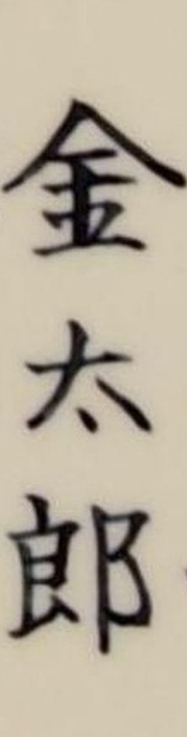金太郎
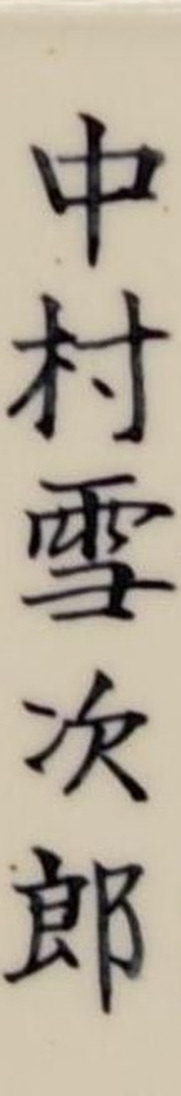中村雪次郎
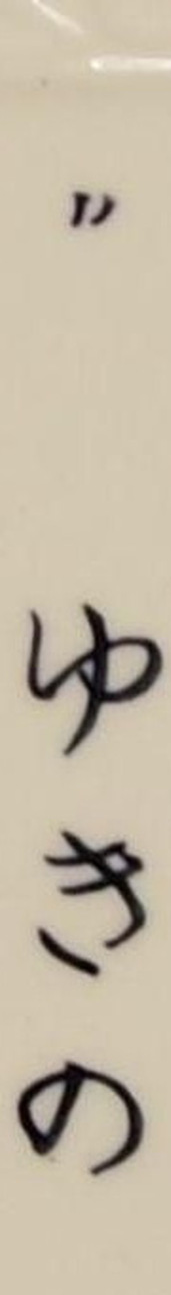ゆきの
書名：A~D
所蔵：koyasan kongobuji
